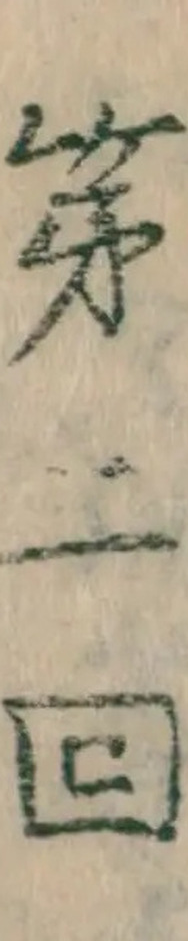第二回
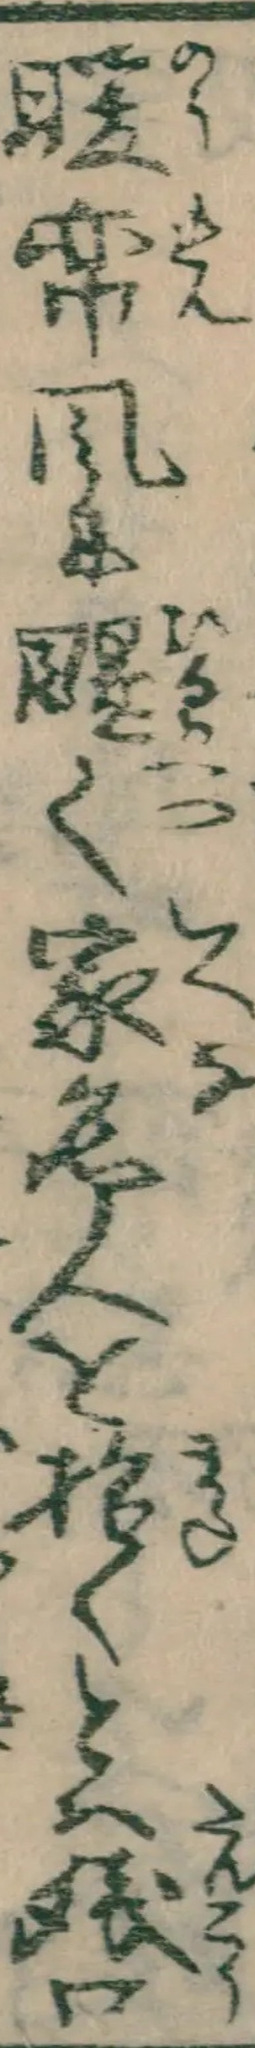暖帘風に醒て家名人を招くとは残口
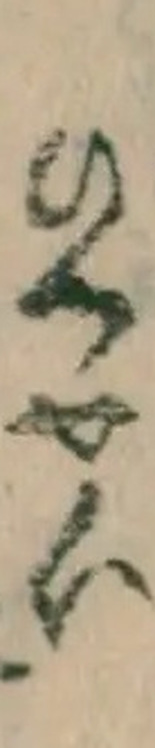ひつやい
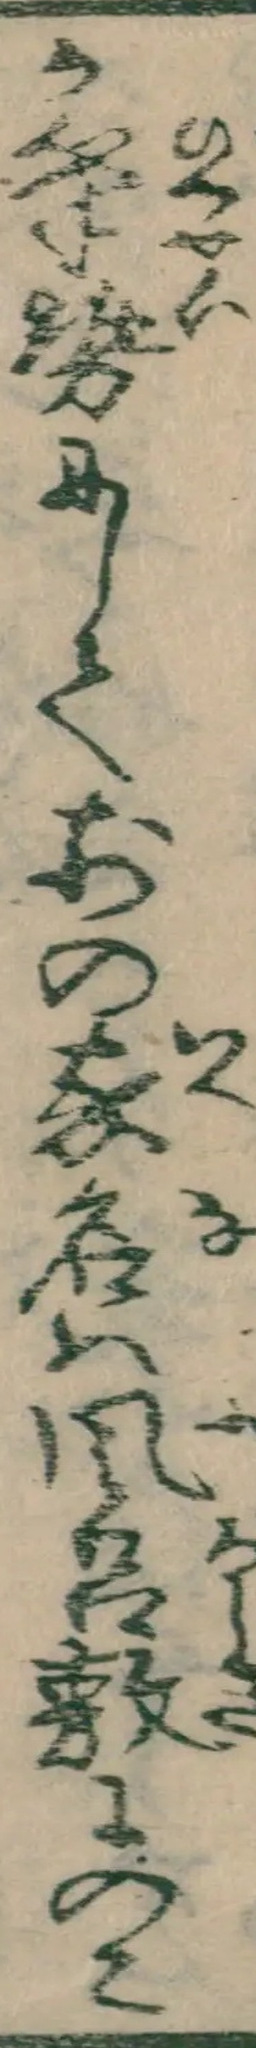か筆勢にして前の家名は風呂敷にのこ

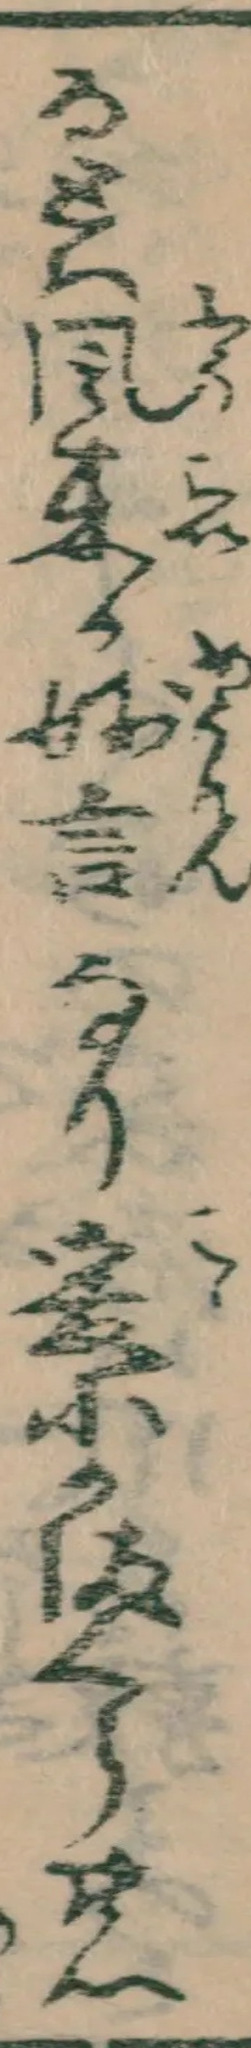るとは風来か妙言なり爰にかまくらの
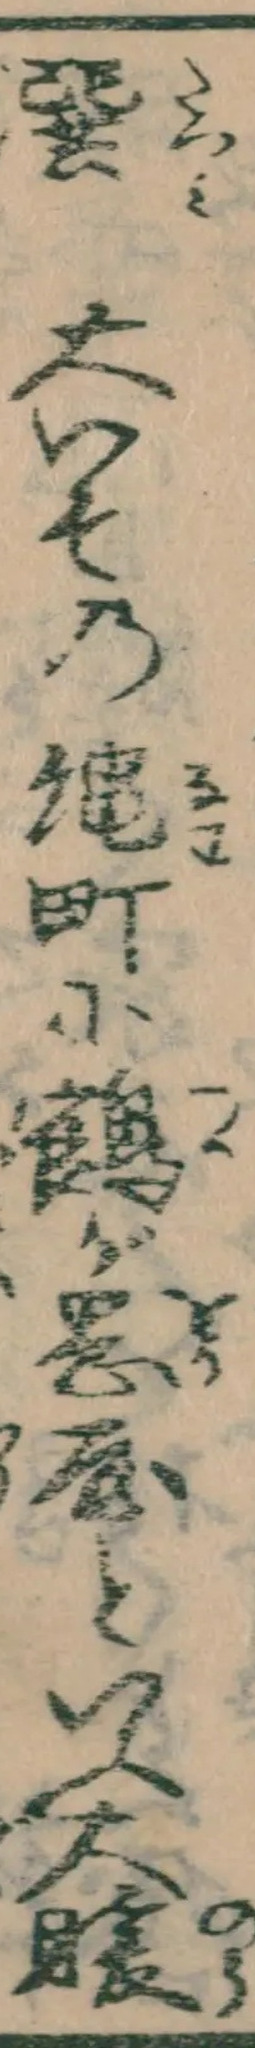巽大いその縄町に鶴が岡屋といふ大暖
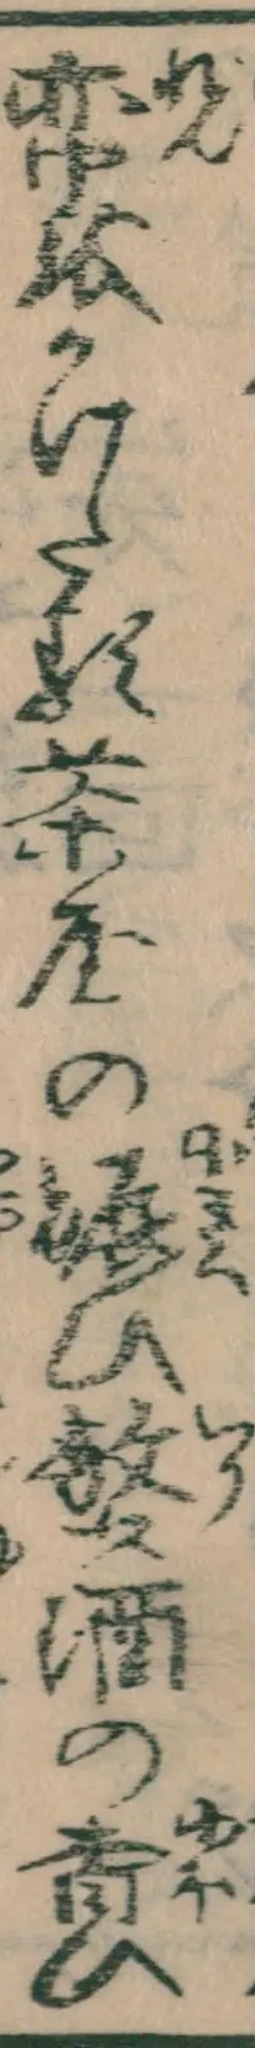帘をかけたる茶屋の賑ひ熬酒の香ひ
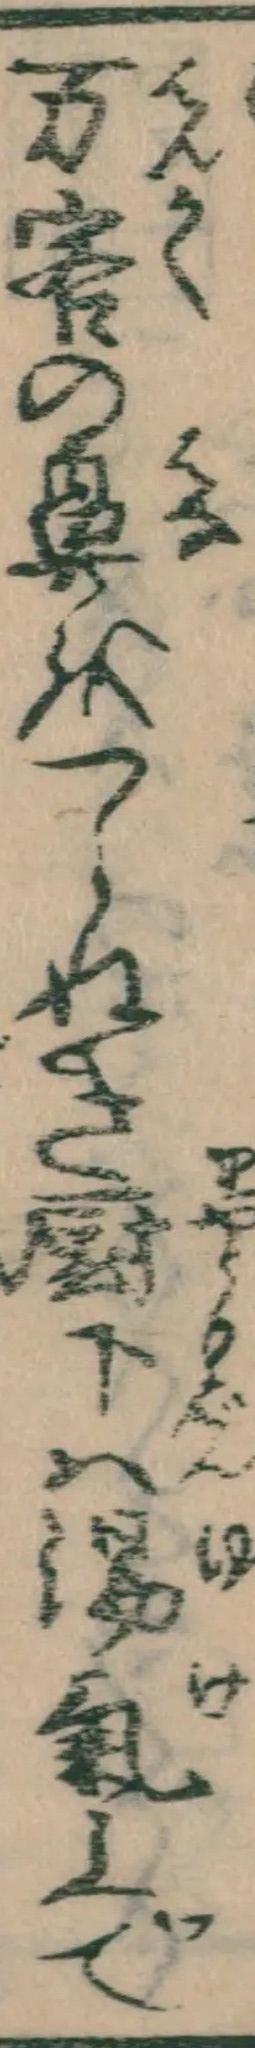万客の鼻をつらねき厨下は湯気上つで
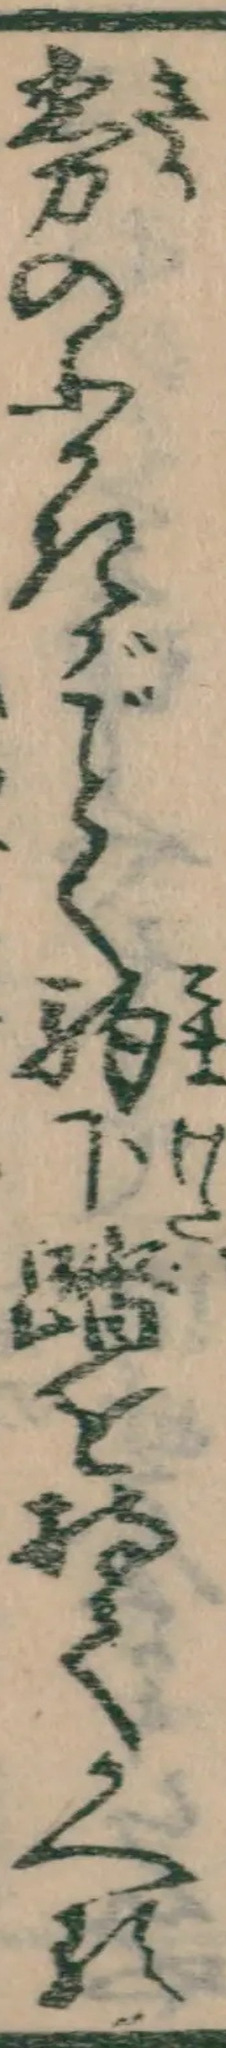霧のふかきがごとく駒下踏を持てかへる
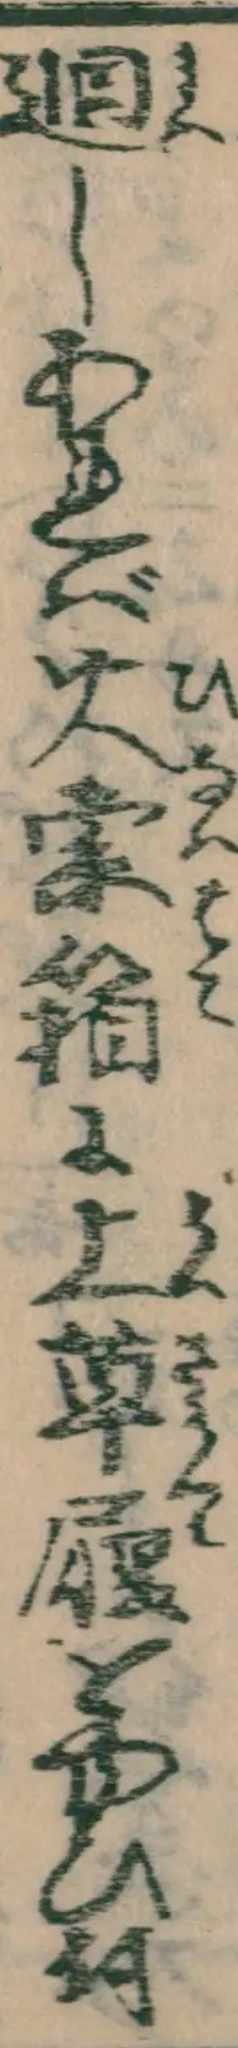廻しあれば火索箱に上草履をゆひ付
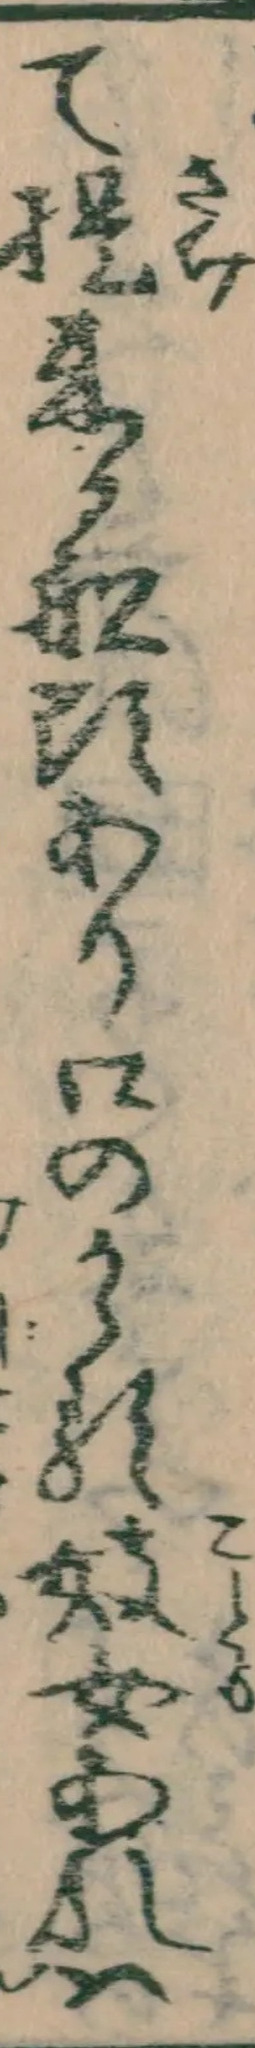て提来る船頭あり口のかゝる妓女あれは
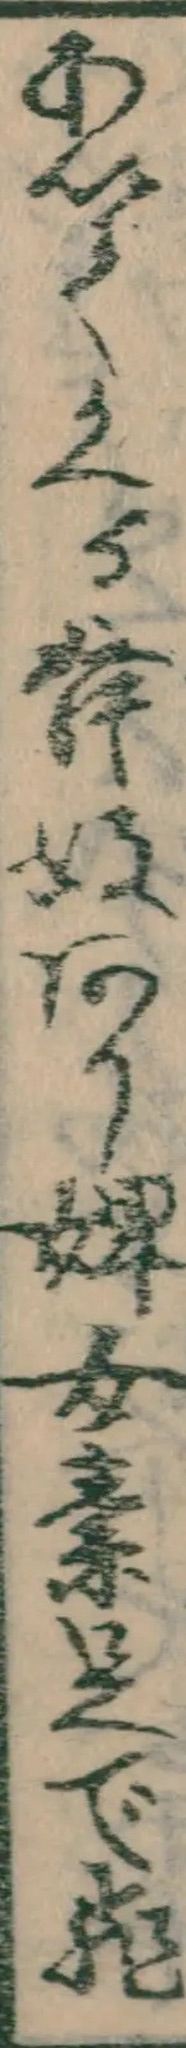あいてかへる舞妓あり婢女素足で飛
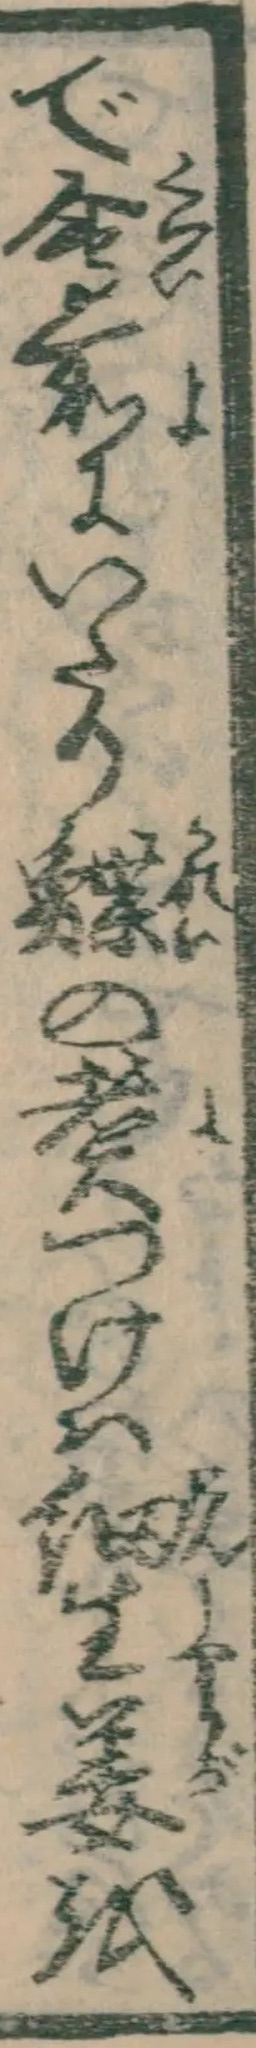で会所にいたり鰈の煮つけは細生姜を
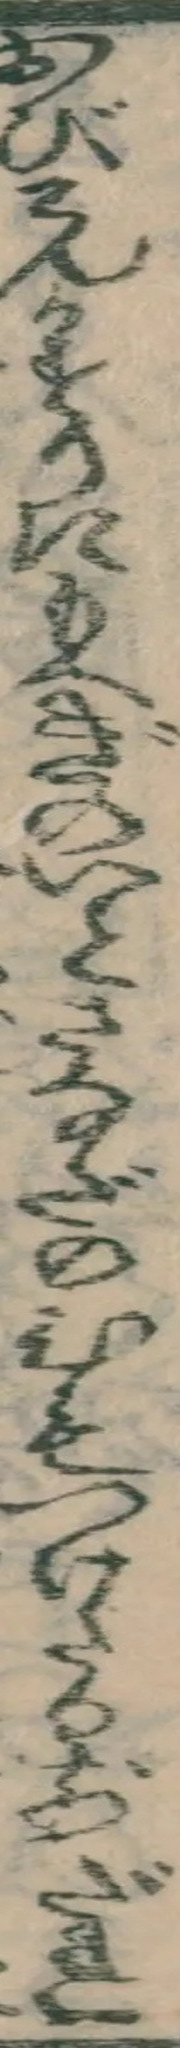おびこんかすりにもへぎのいとさなだのひもつけたる前だれ
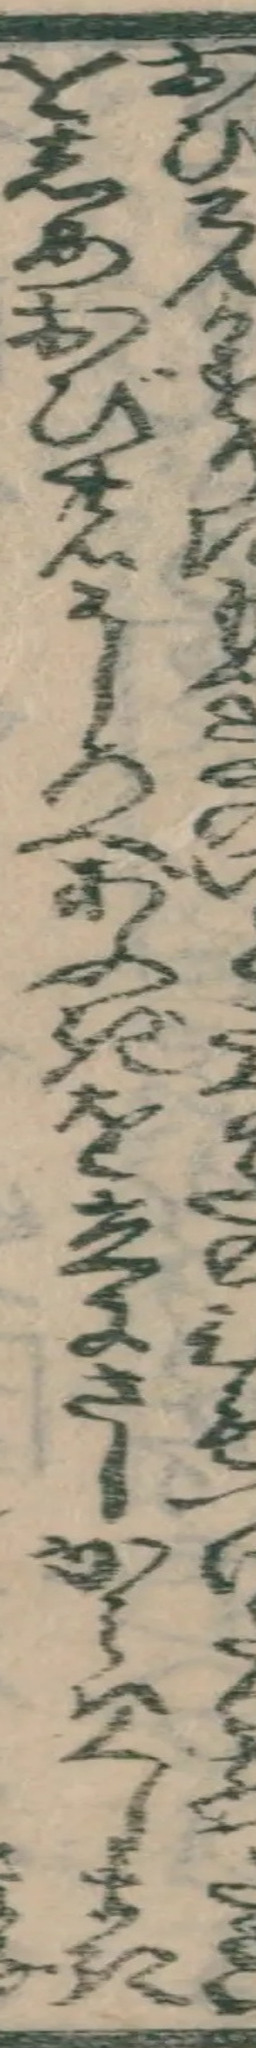をしめおびのうしろへあふぎを立にさしかみはくしまき
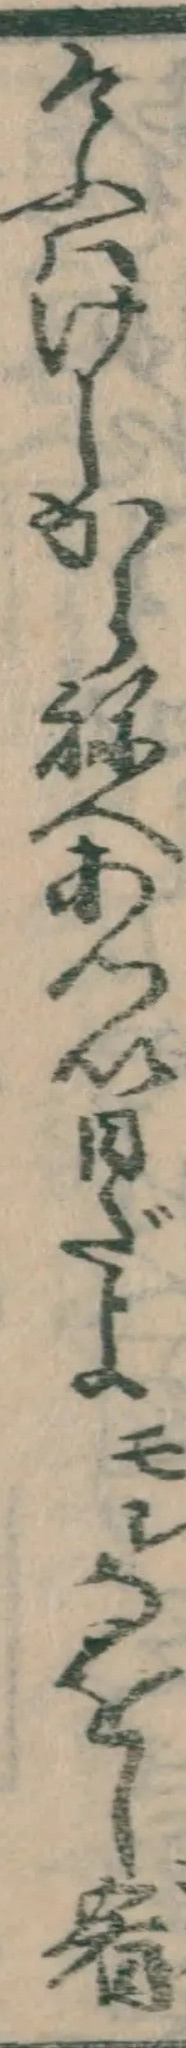けふはけしからねへあつい日だよモシなをし肴
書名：教訓読本：大礒風俗仕懸文庫
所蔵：国立国会図書館 National Diet Library, JAPAN
